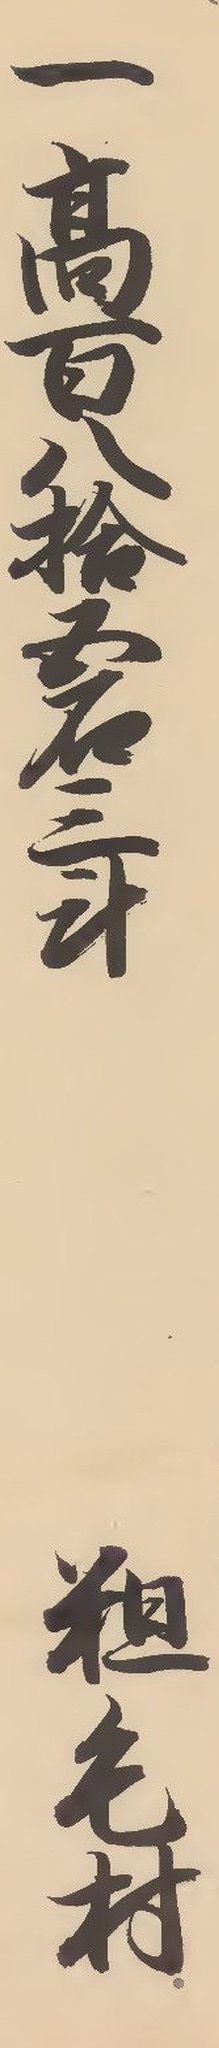一高百八拾五石三斗粗毛村
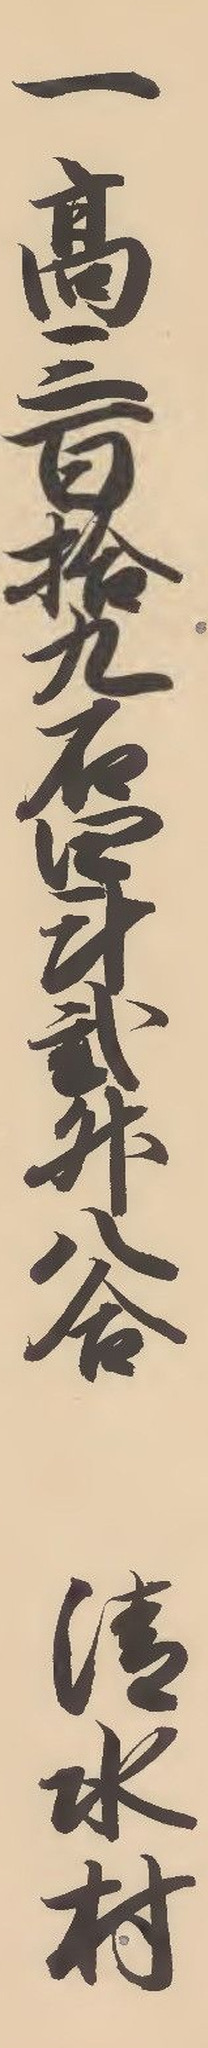一高三百拾九石四斗弐升八合清水村
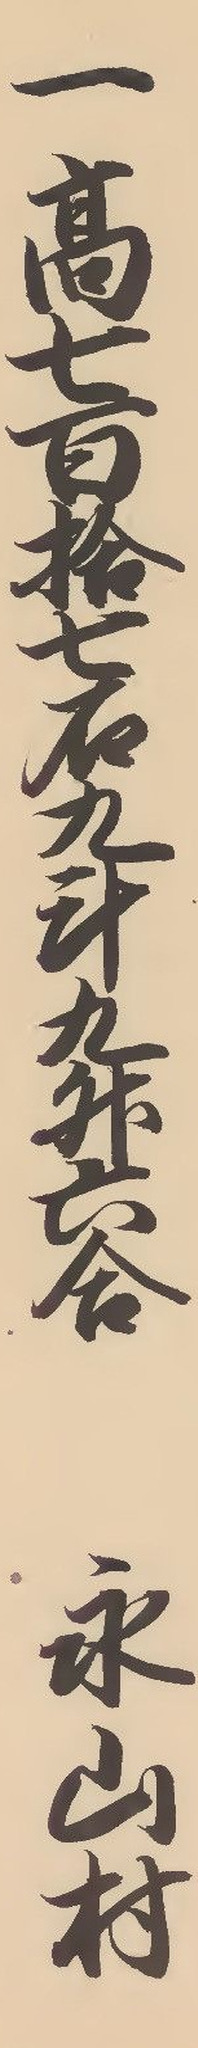一高七百拾七石九斗九升六合永山村

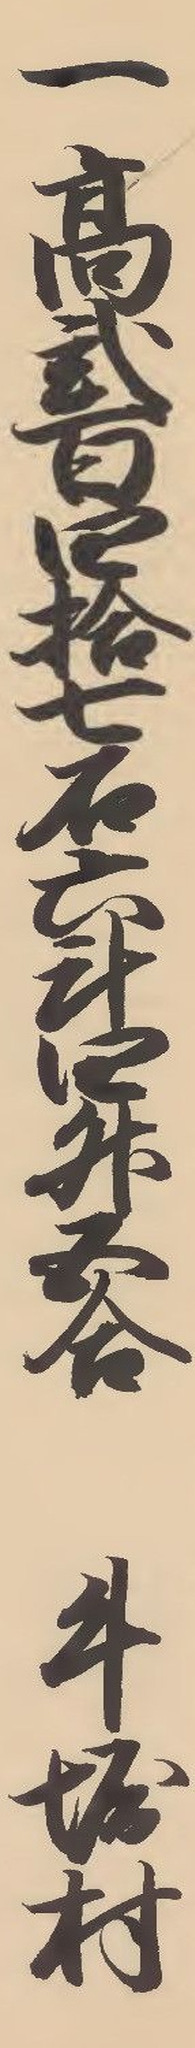一高弐百四拾七石六斗四升五合牛堀村
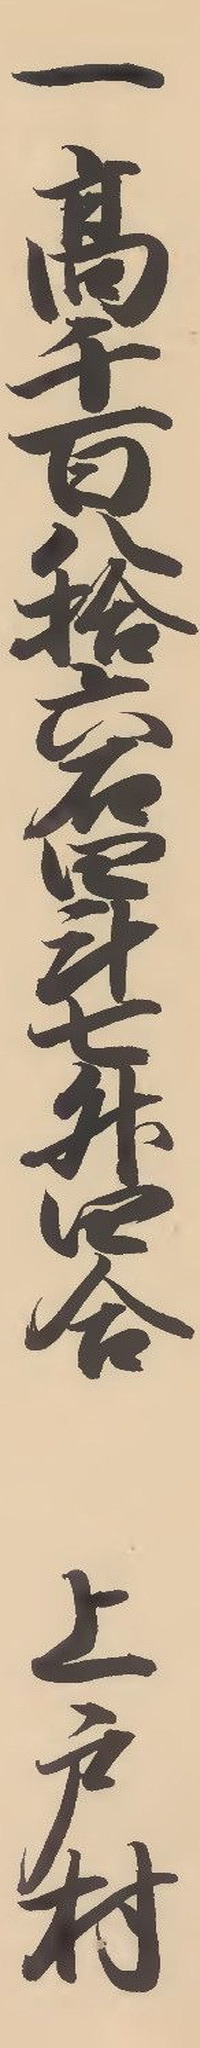一高千百八拾六石四斗七升四合上戸村
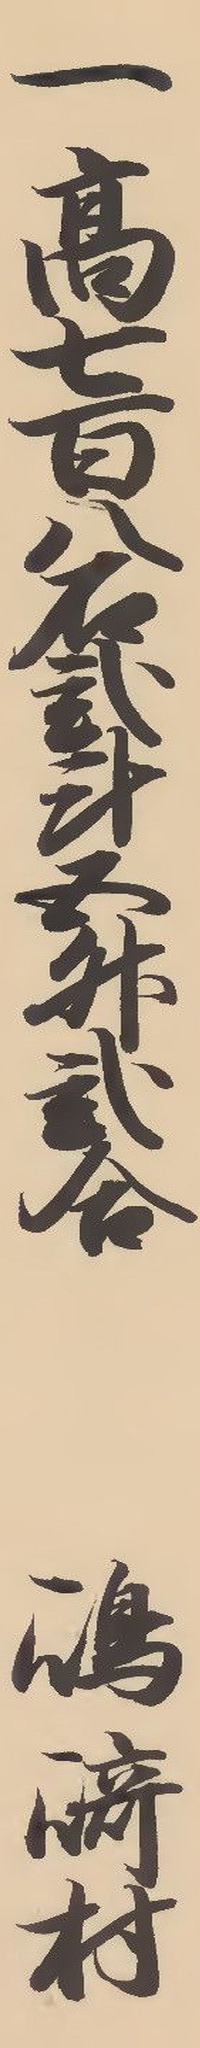一高七百八石弐斗五升弐合島崎村
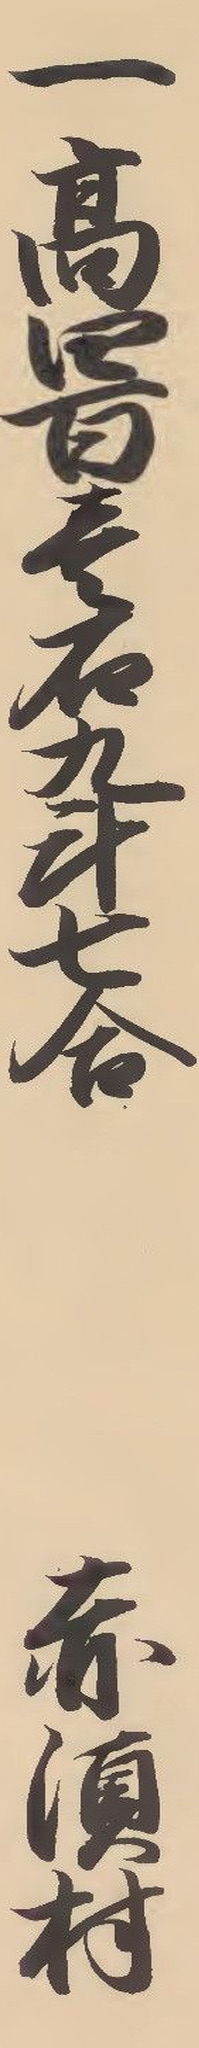一高四百壱石九斗七合赤須村
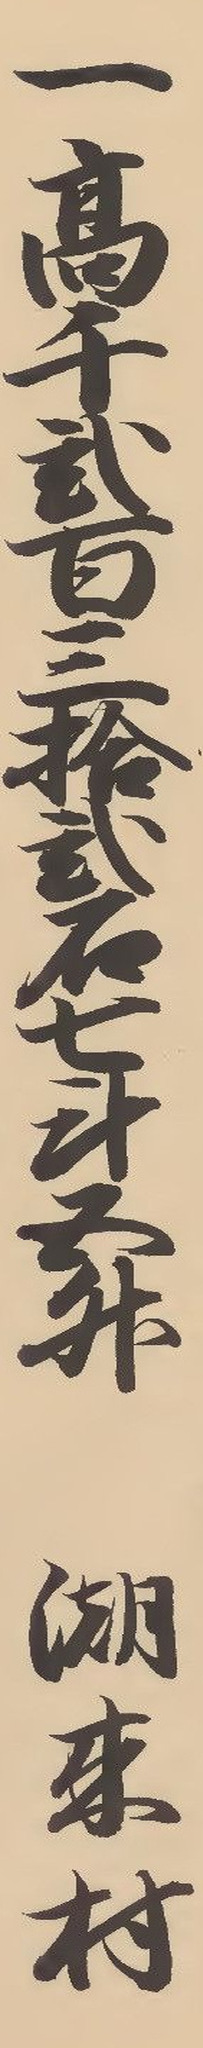一高千弐百三拾弐石七斗五升潮来村
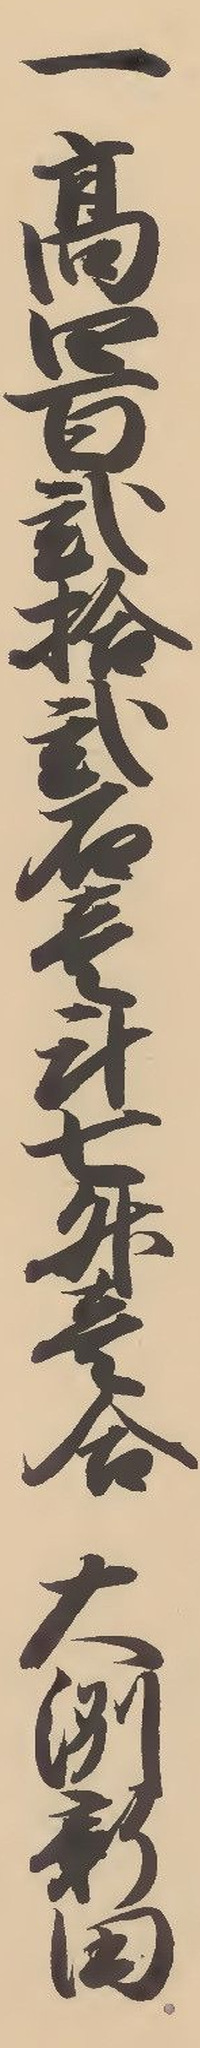一高四百弐拾弐石壱斗七升壱合大洲新田
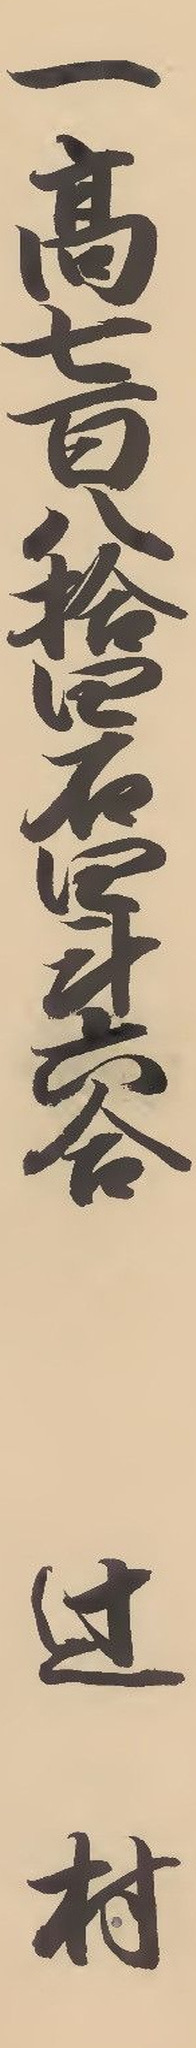一高七百八拾四石四斗六合辻村
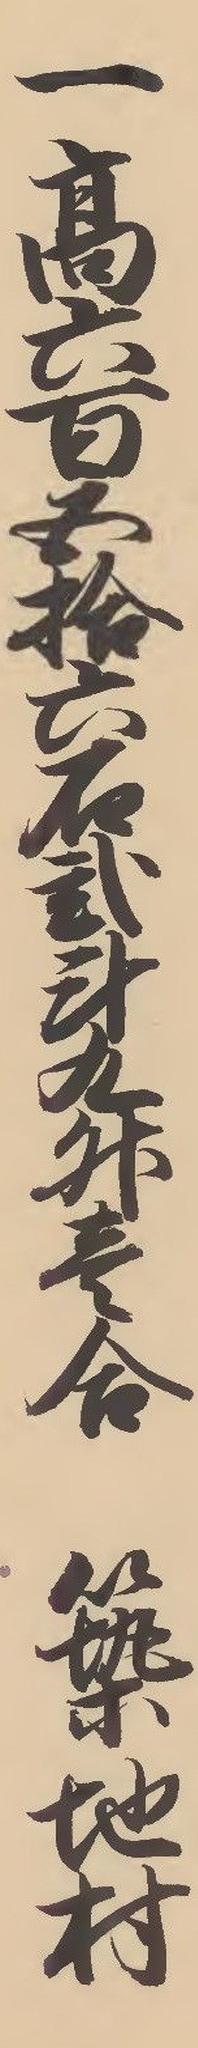一高六百五拾六石弐斗九升壱合築地村

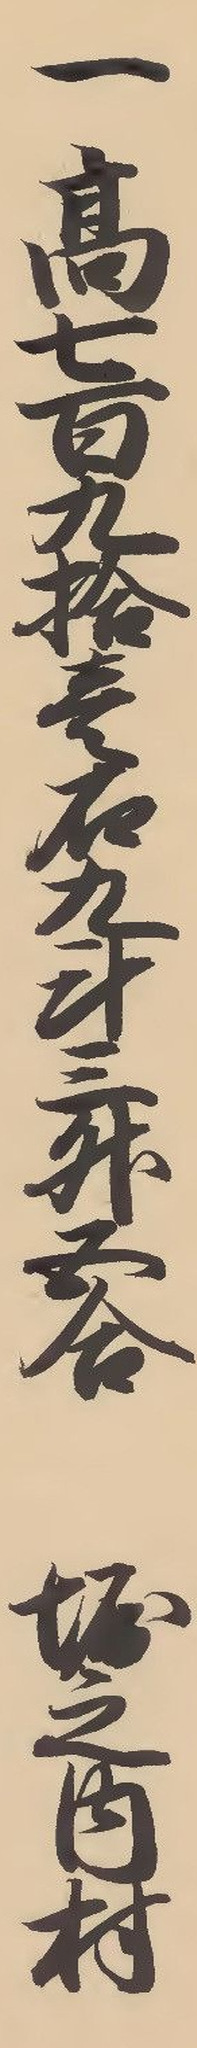一高七百九拾壱石九斗三升五合堀之内村
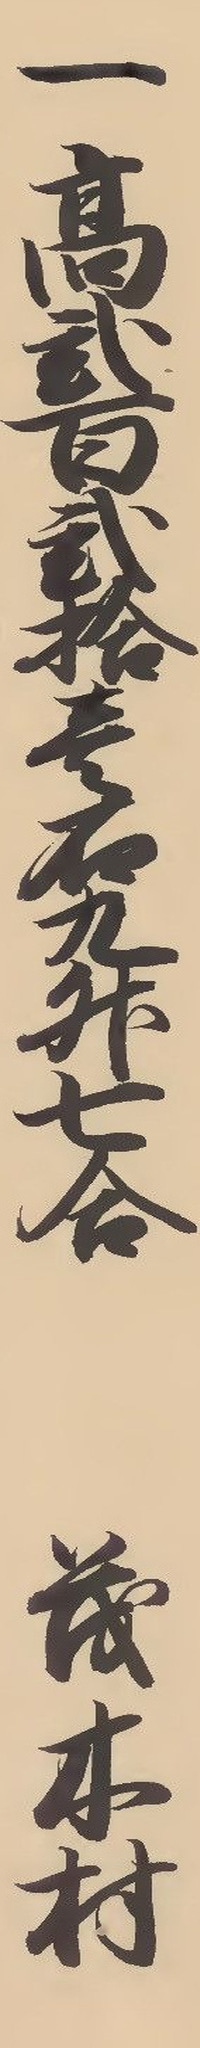一高弐百弐拾壱石九升七合茂木村
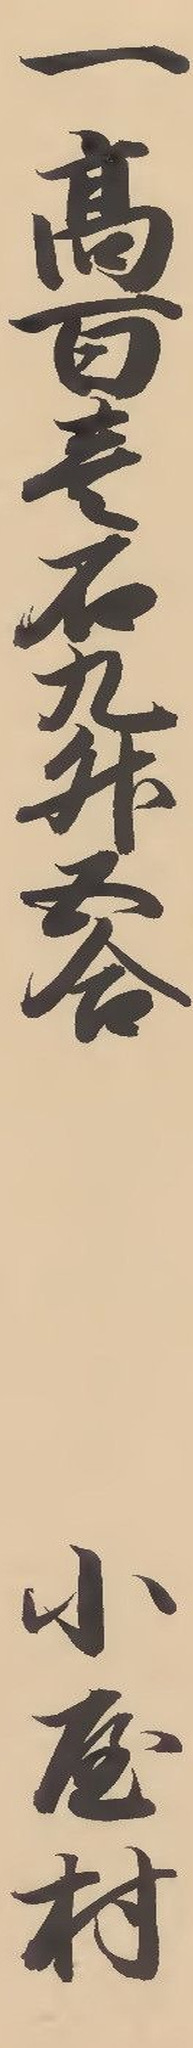一高百壱石九升五合小屋村
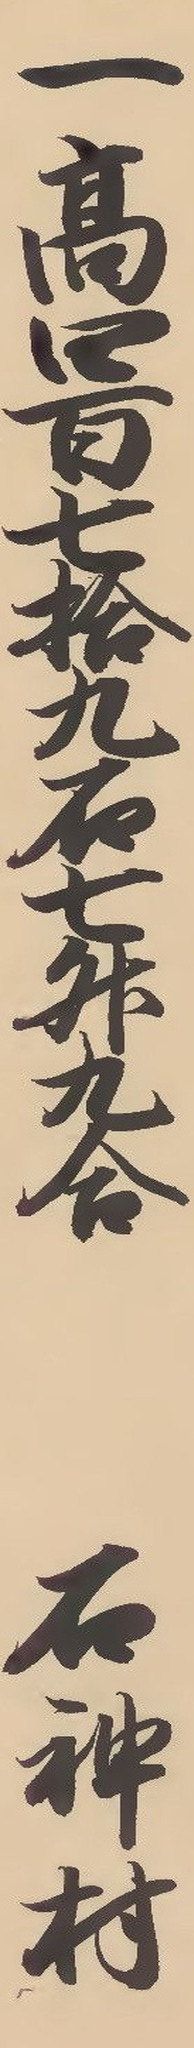一高四百七拾九石七升九合石神村
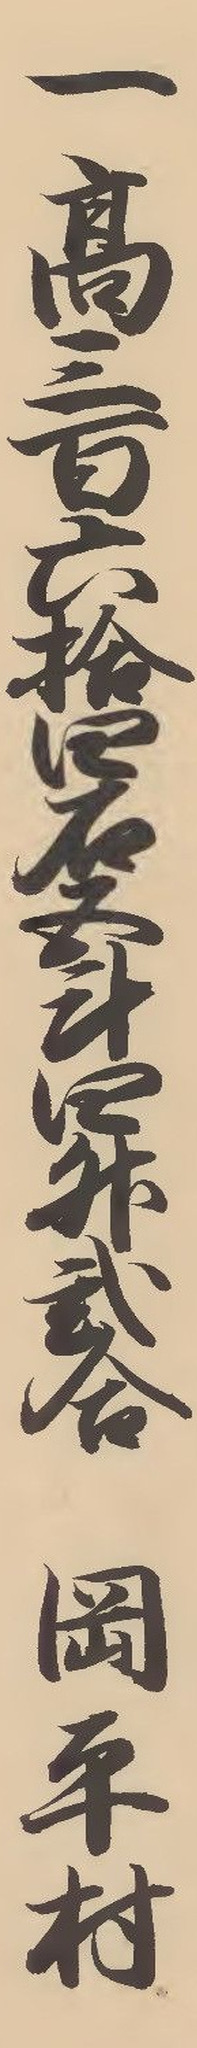一高三百六拾四石五斗四升弐合岡平村
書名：常陸国郷帳
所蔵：国立公文書館 National Archives of Japan
